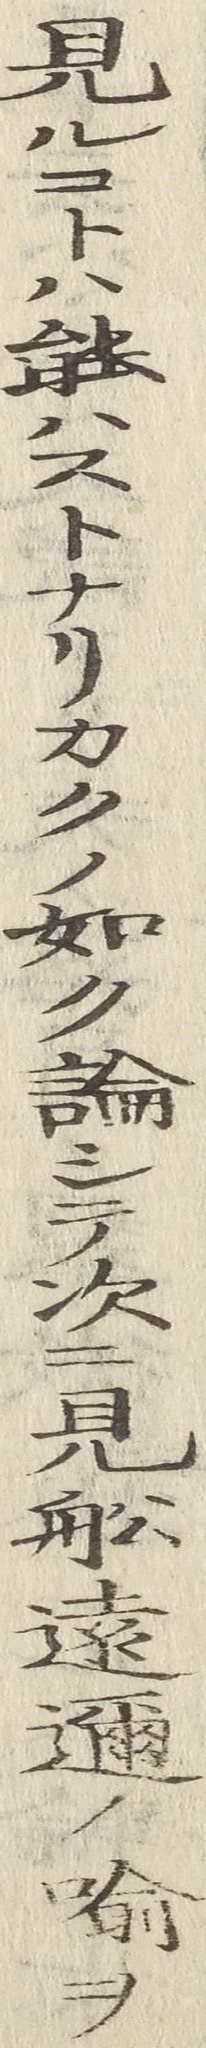見ルコトハ能ハストナリカクノ如ク論シテ次ニ見船遠邇ノ喩ヲ
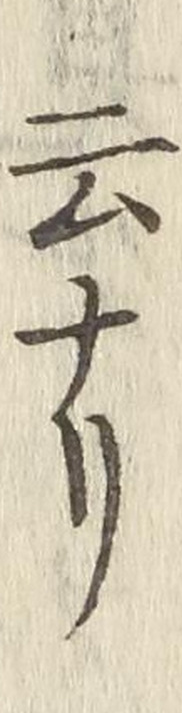云ナリ
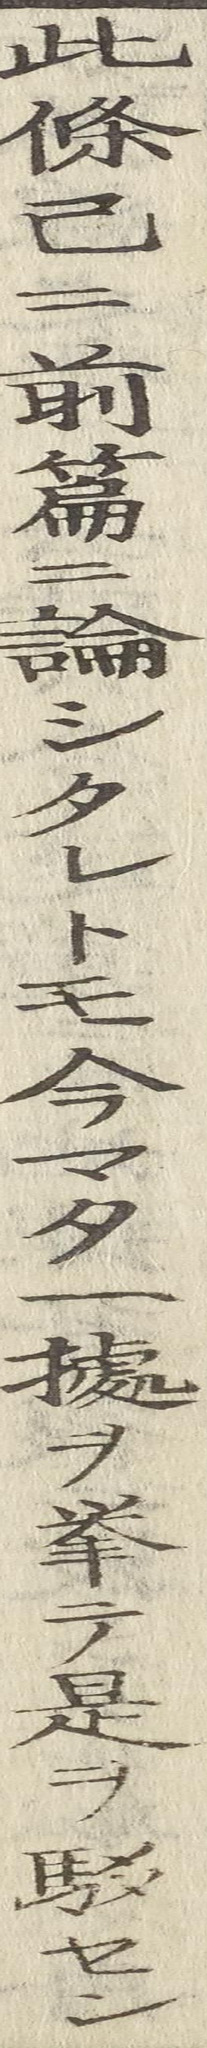此条已ニ前篇ニ論シタレトモ今マタ一拠ヲ挙テ是ヲ駁セン
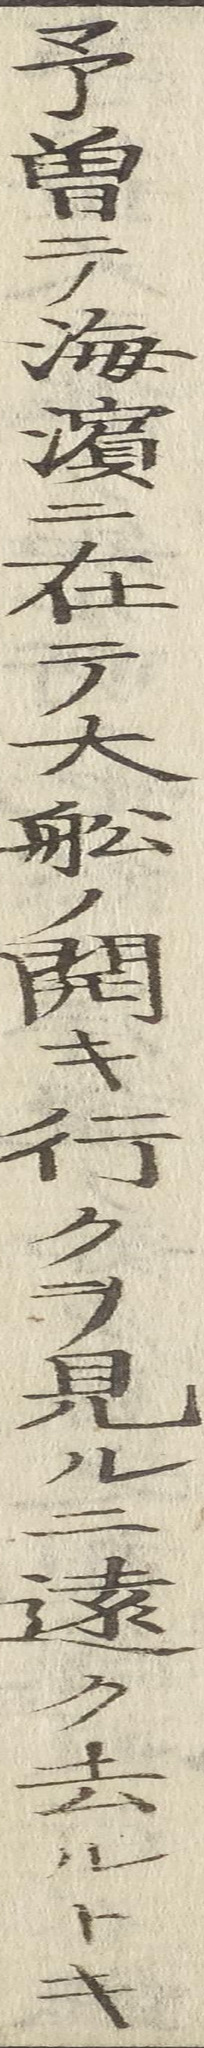予曾テ海浜ニ在テ大船ノ開キ行クヲ見ルニ遠ク去ルトキ

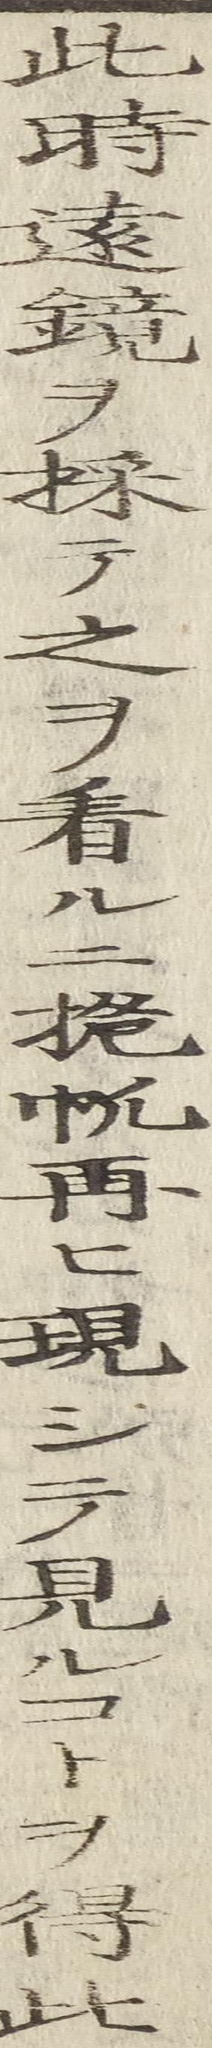此時遠鏡ヲ採テ之ヲ看ルニ桅帆再ヒ現シテ見ルコトヲ得此
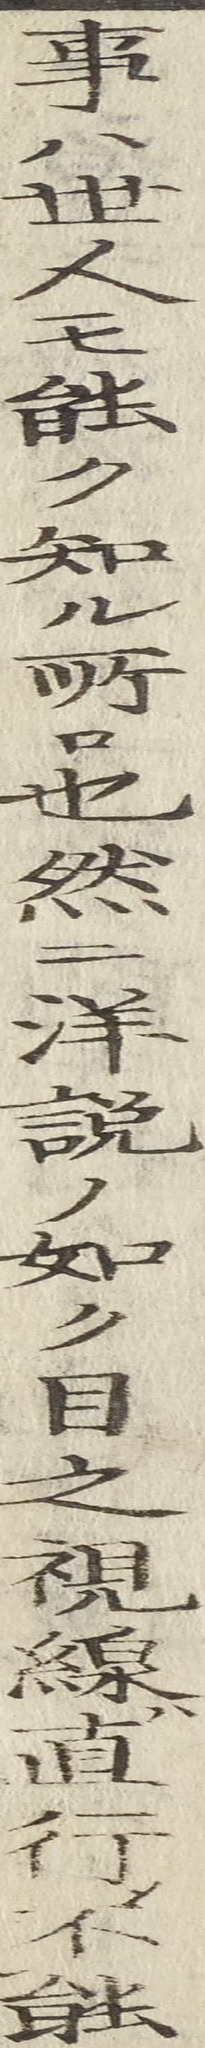事ハ世人モ能ク知ル所ロ也然ニ洋説ノ如ク目之視線直行不能
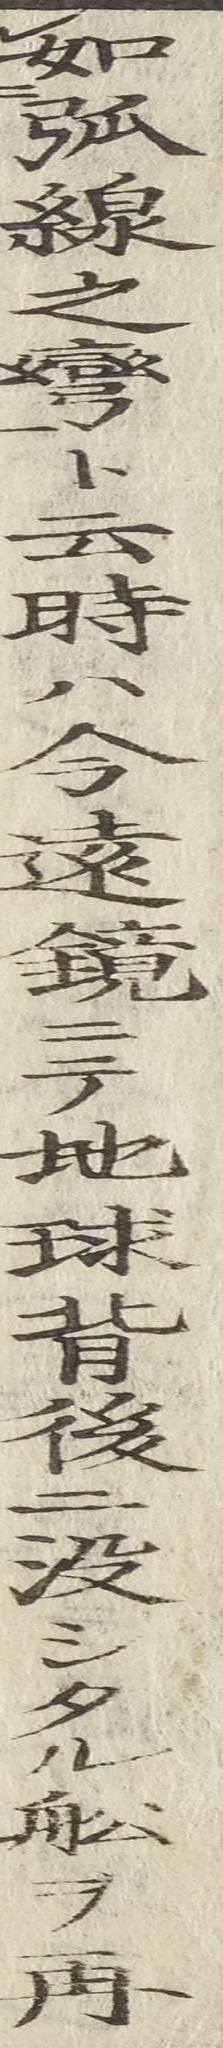如ニ弧線ノ彎ト云時ハ今遠鏡ニテ地球背後ニ没シタル船ヲ再
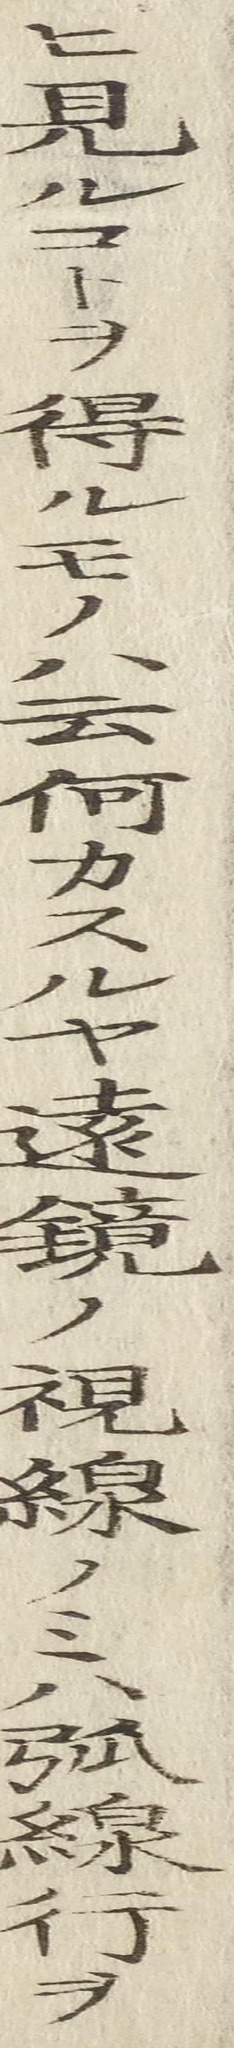ヒ見ルコトヲ得ルモノハ云何カスルヤ遠鏡ノ視線ノミハ弧線行ヲ
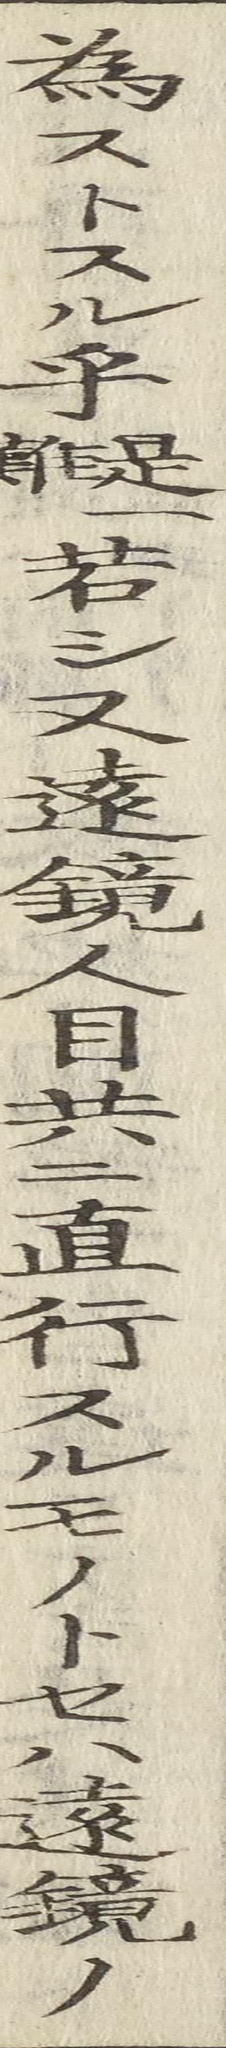為ストスル乎是一難若シ又遠鏡人目共ニ直行スルモノトセハ遠鏡ノ
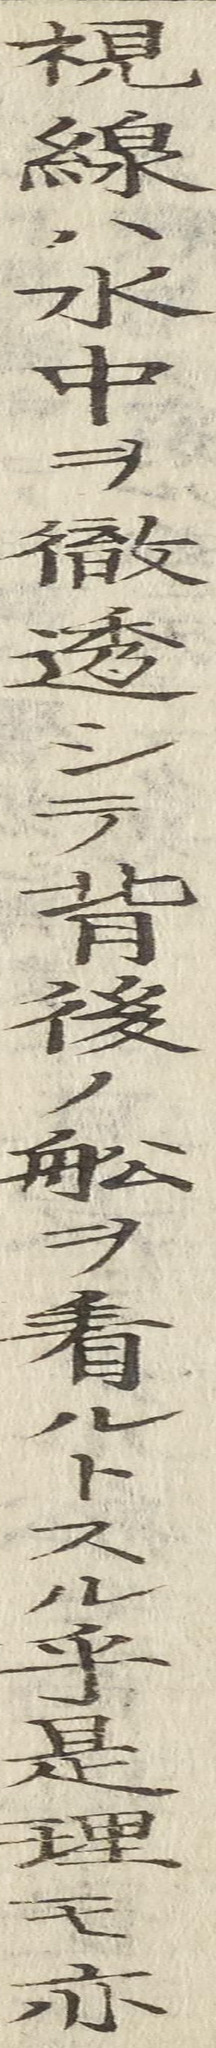視線ハ水中ヲ徹透シテ背後ノ船ヲ看ルトスル乎是理モ亦
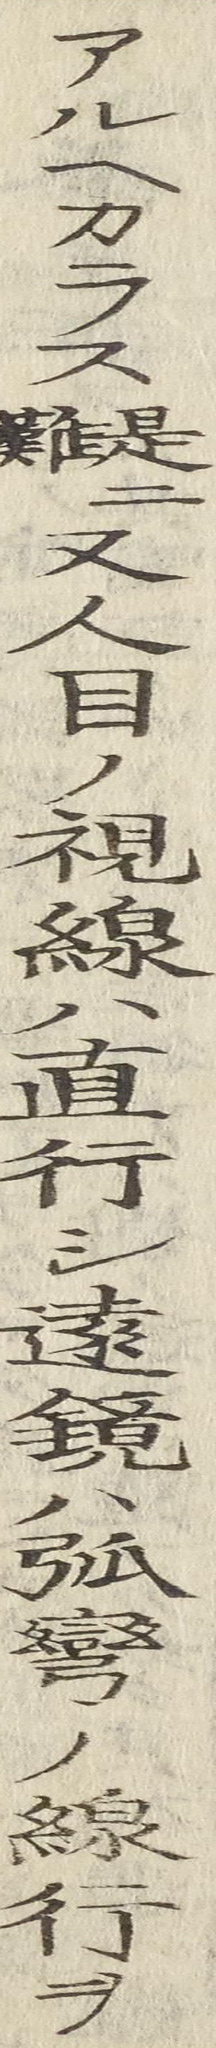アルヘカラス是ニ難又人目ノ視線ハ直行シ遠鏡ハ弧彎ノ線行ヲ
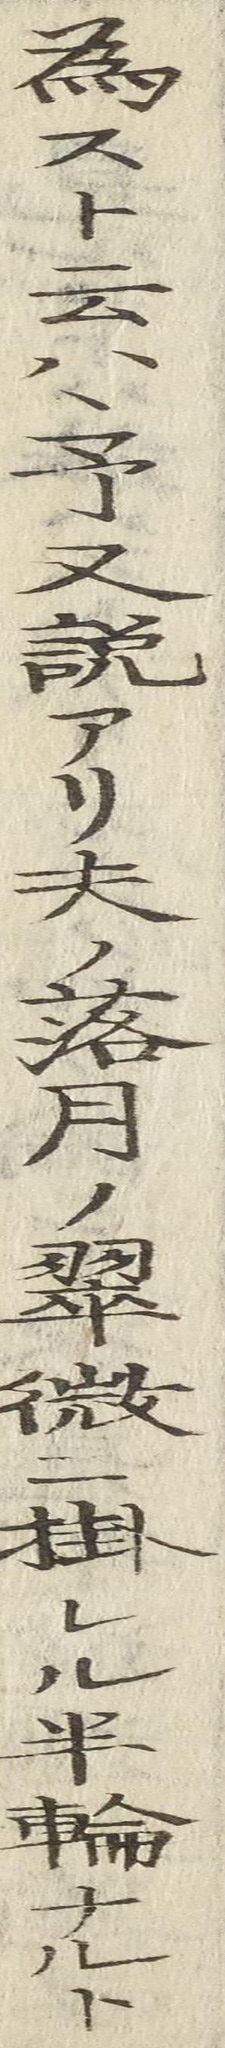為スト云ハヽ予又説アリ夫ノ落月ノ翠微ニ掛レル半輪ナルト
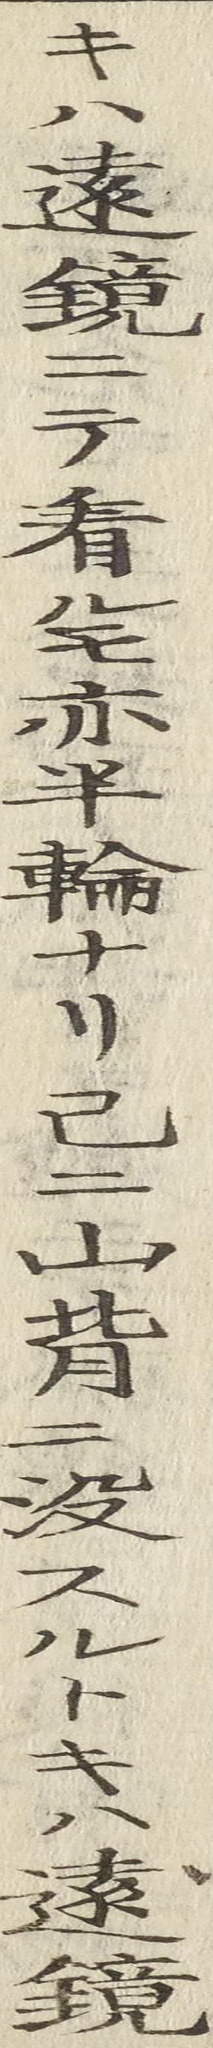キハ遠鏡ニテ看ルモ亦半輪ナリ已ニ山背ニ没スルトキハ遠鏡
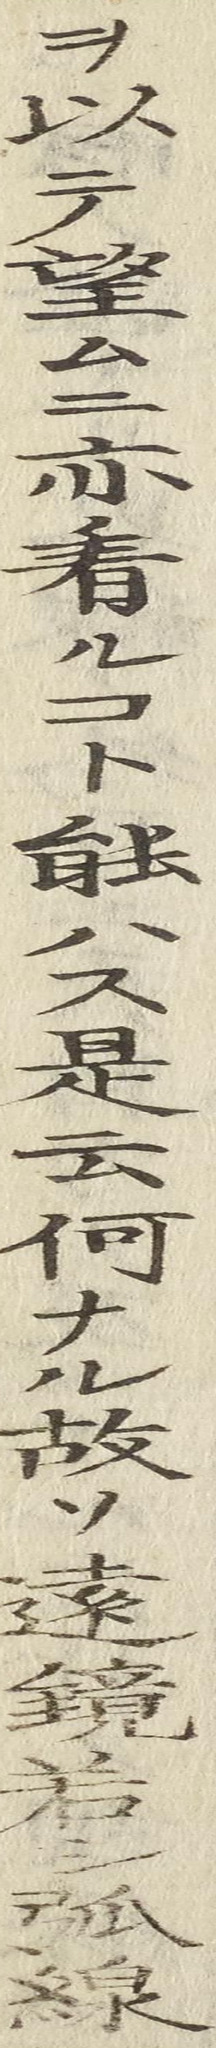ヲ以テ望ムニ亦看ルコト能ハス是云何ナル故ソ遠鏡若シ弧線
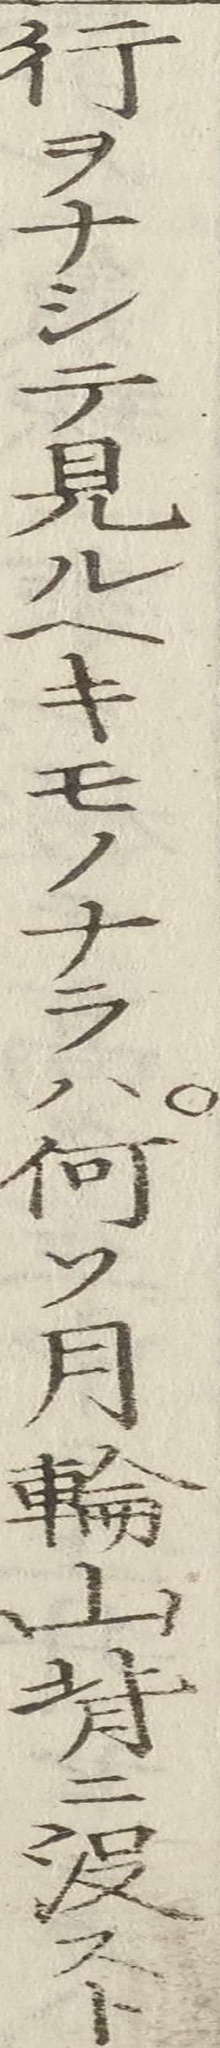行ヲナシテ見ルヘキモノナラハ。何ソ月輪山背ニ没スト
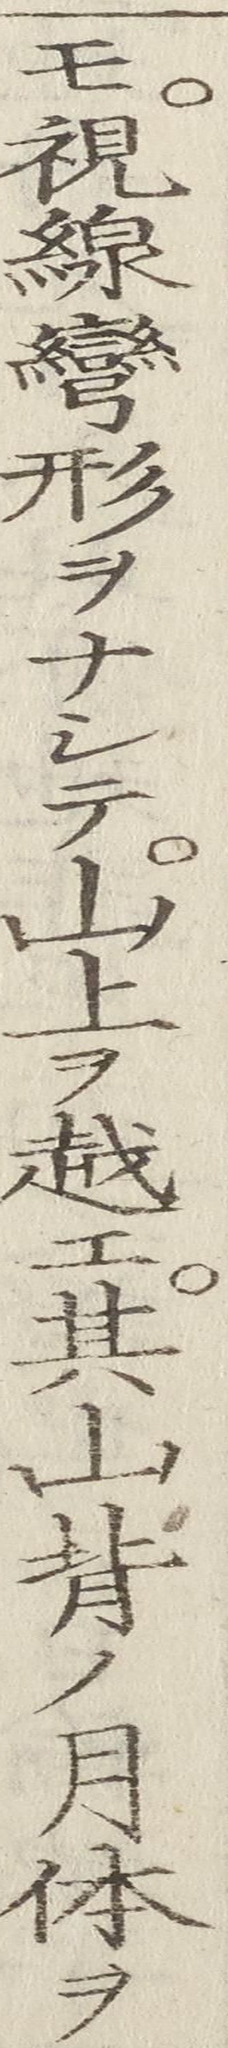モ。視線彎形ヲナシテ。山上ヲ越エ。其山背ノ月体ヲ
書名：護法新論　二編　下
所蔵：東京大学地震研究所図書室 Earthquake Research Institute Library, The University of Tokyo, JAPAN
